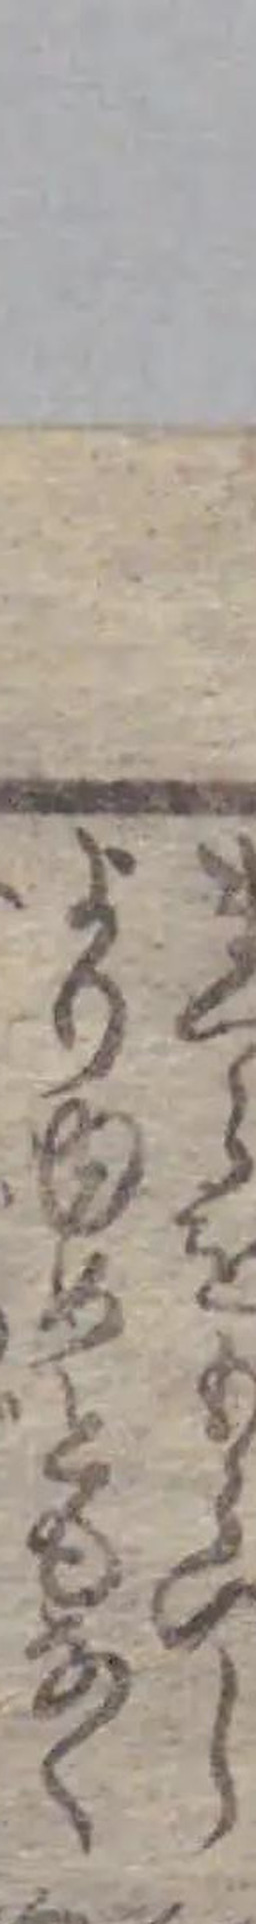よりゆめともなく
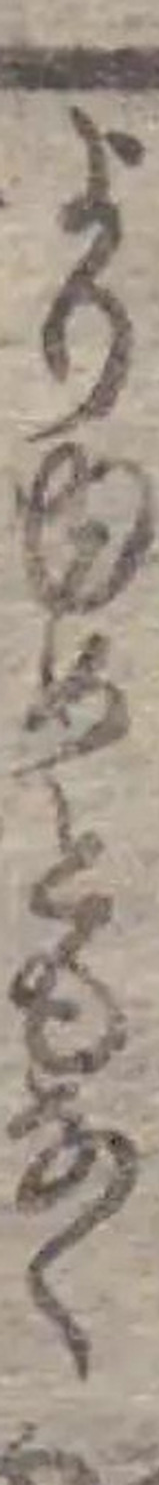よりゆめともなく
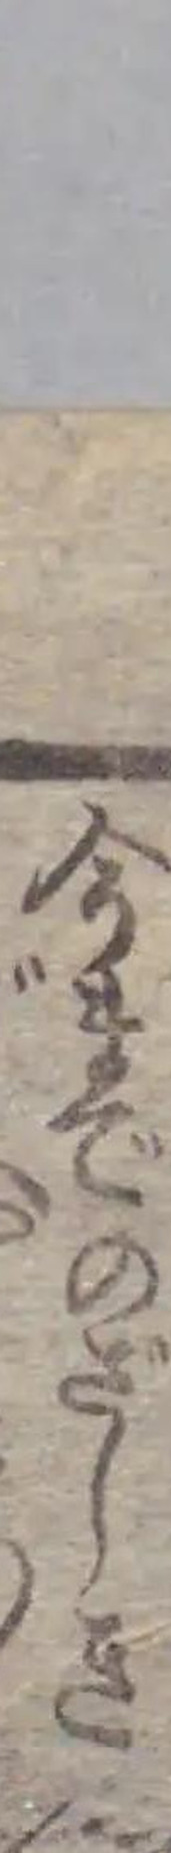今までのざしき
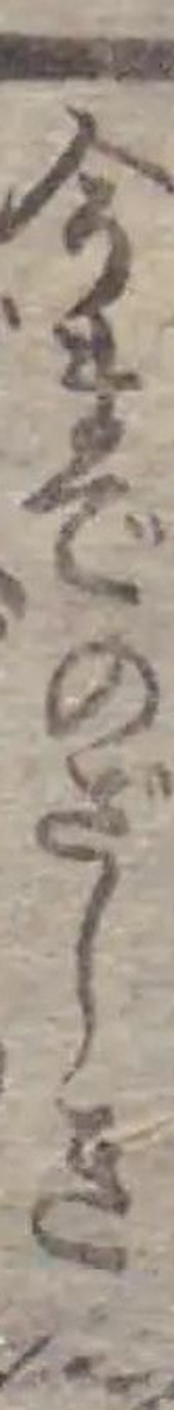今までのざしき
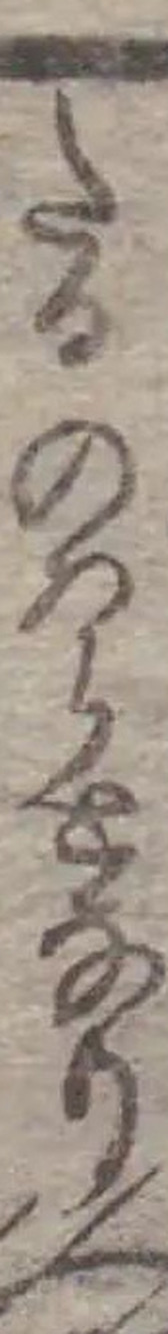たるのはらとなり
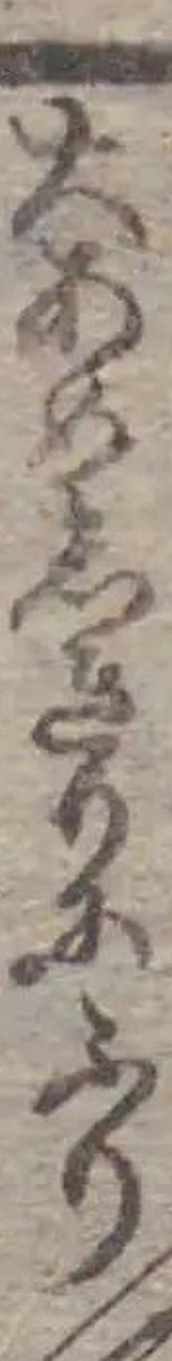大あらしきうにふり
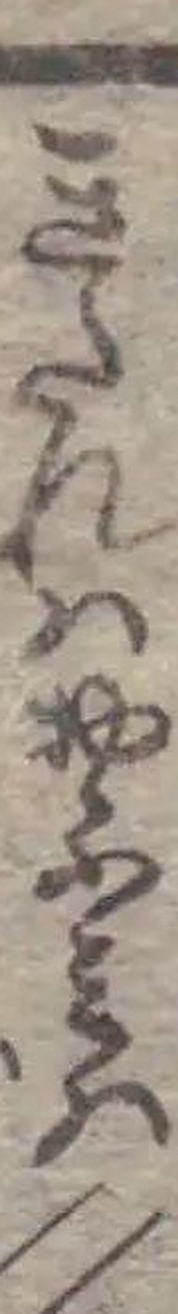きたれはおふみは
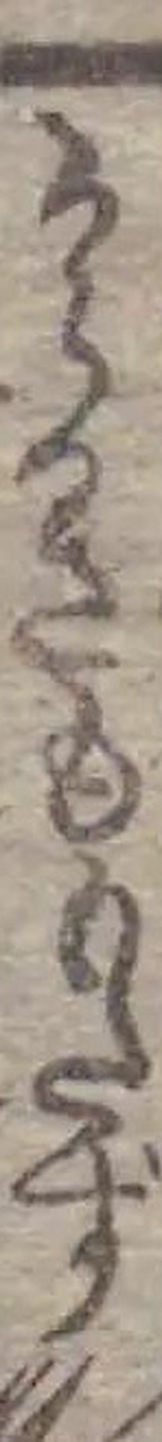かくるきももたず
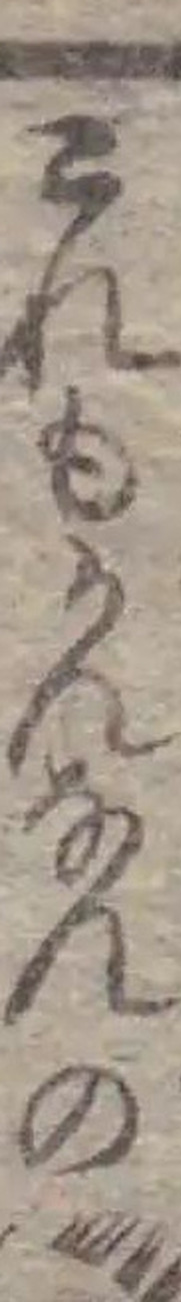これもかんなんの
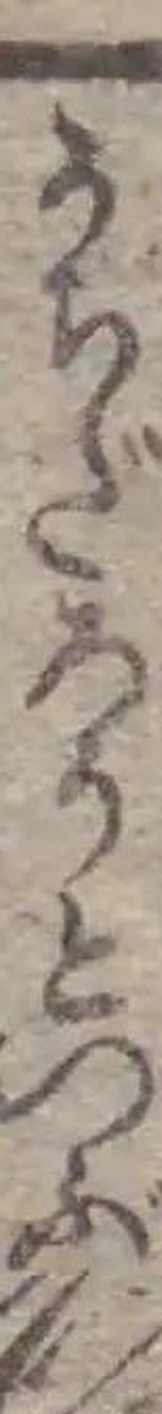うちだろうとつぶ
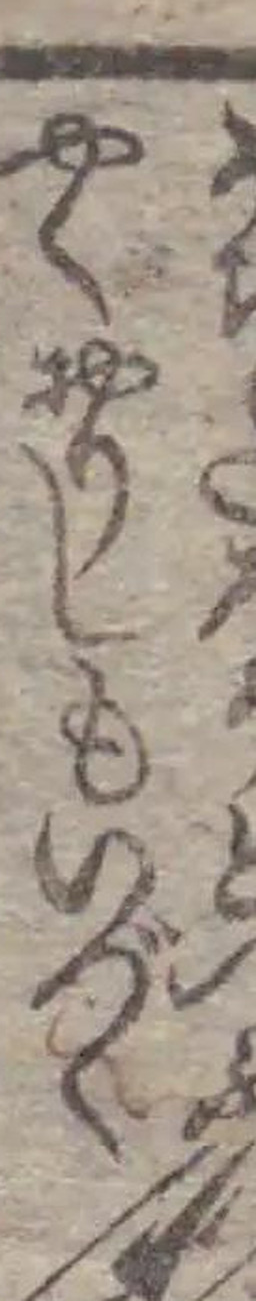やくおりしもいづく
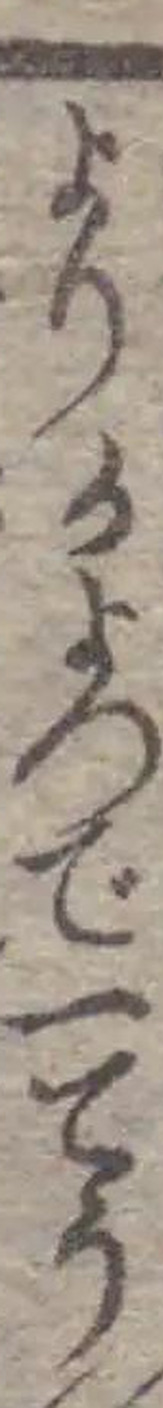よりかよつで一てう
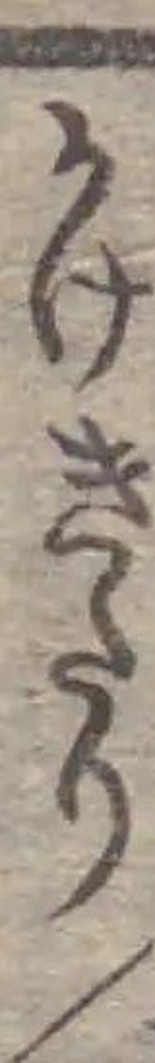かけきたり
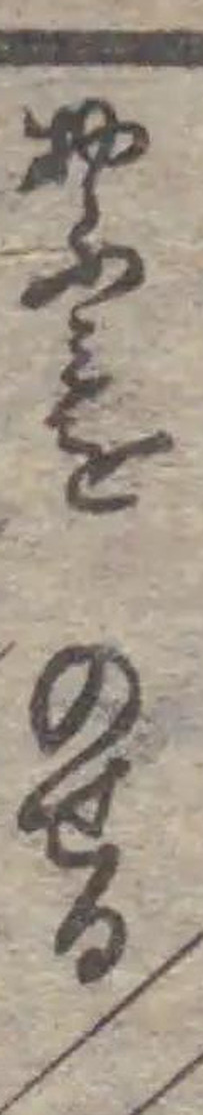おふみをのせる
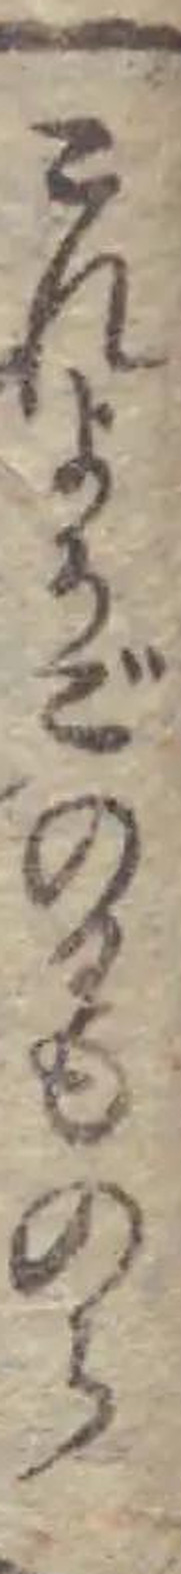これよかごのるものら
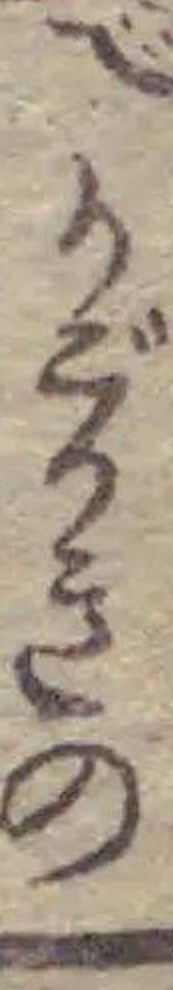かごかきの
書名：かんなんの夢枕 2巻
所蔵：国立国会図書館 National Diet Library, JAPAN
